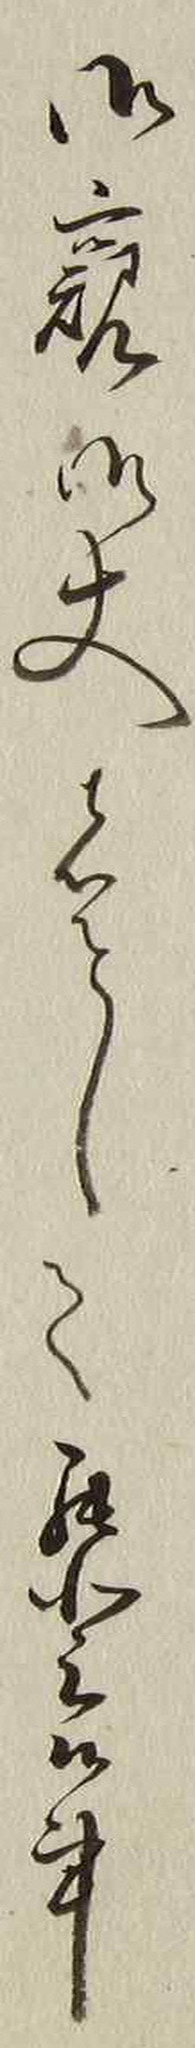御窺御使者として罷登候事
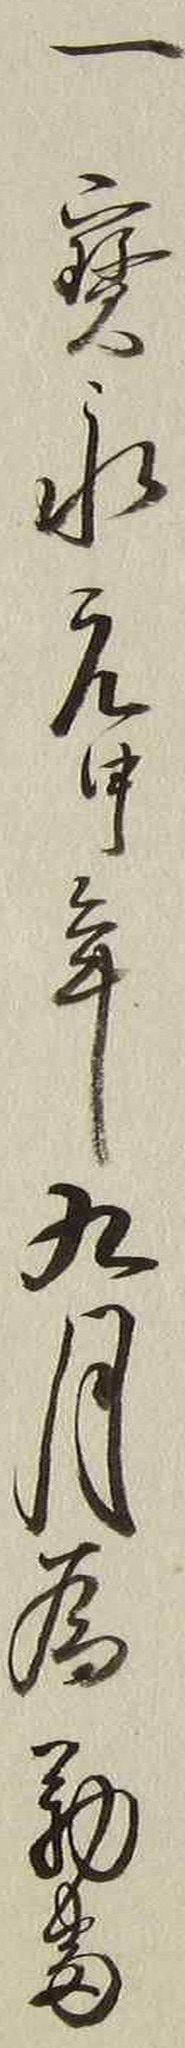一宝永元申年九月為勤番
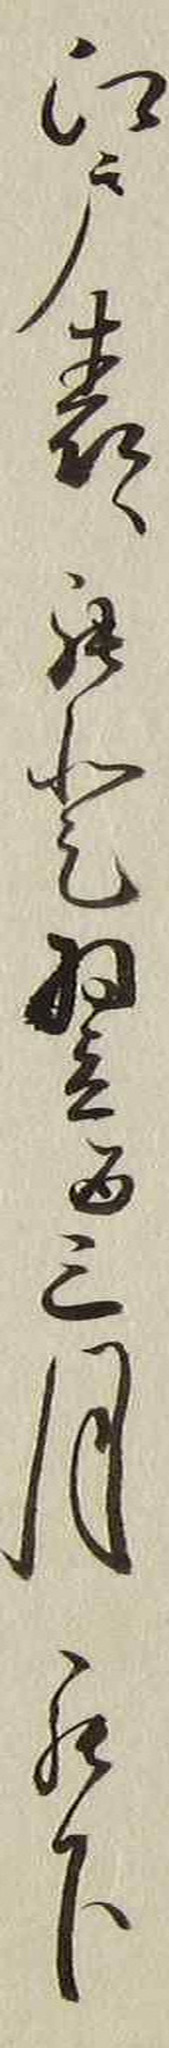江戸表へ罷登翌酉三月罷下
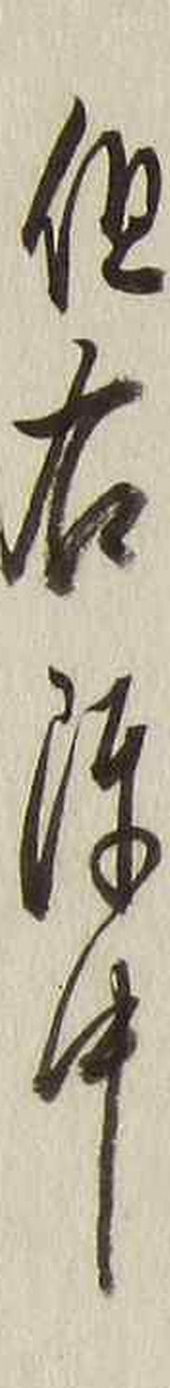但右陣中
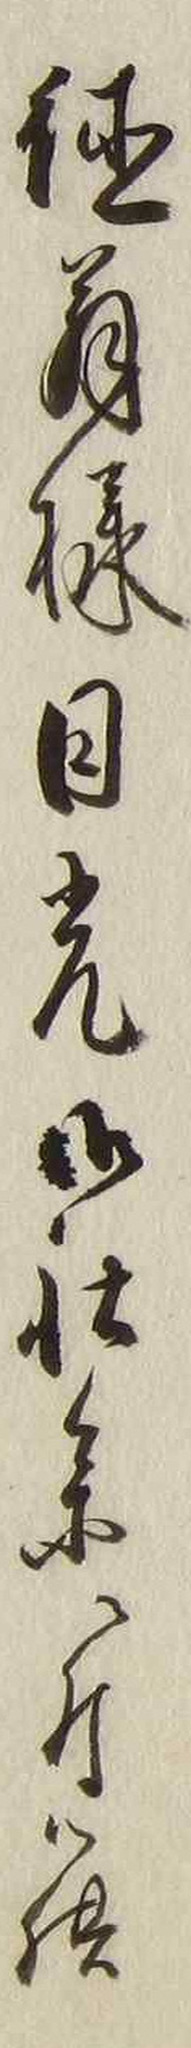徳翁様日光御社参ニ付御供

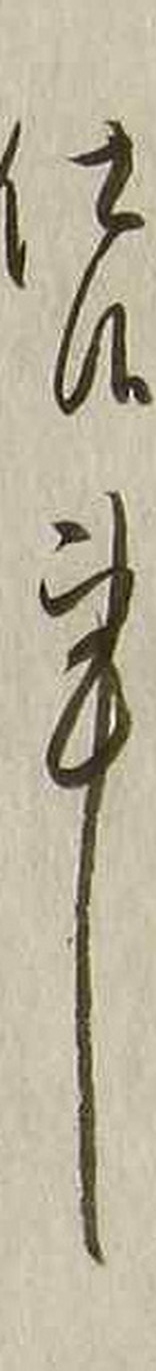仕候事
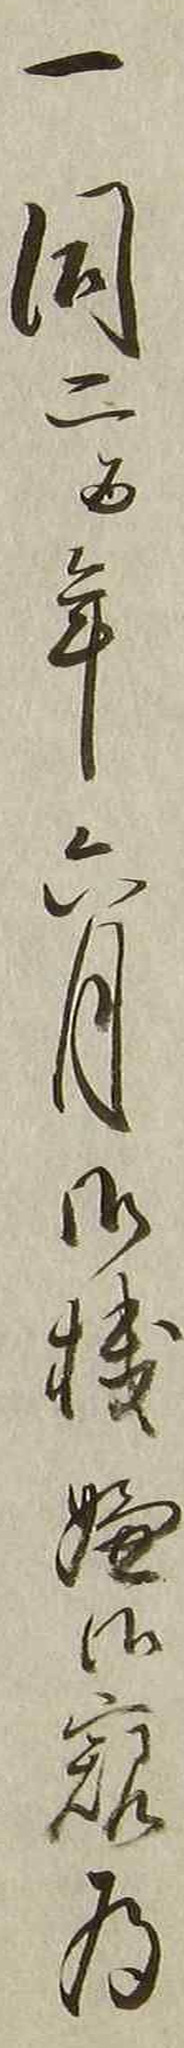一同二酉年六月御機嫌御窺為
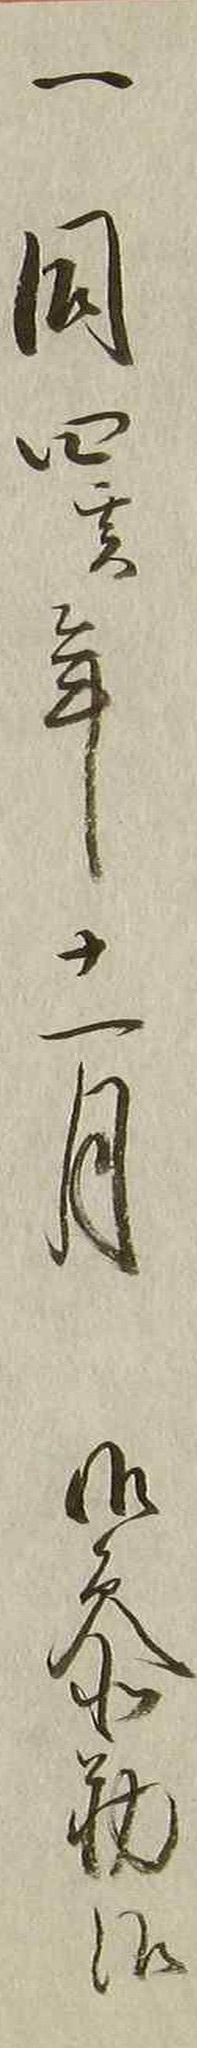一同四亥年十一月御参勤御
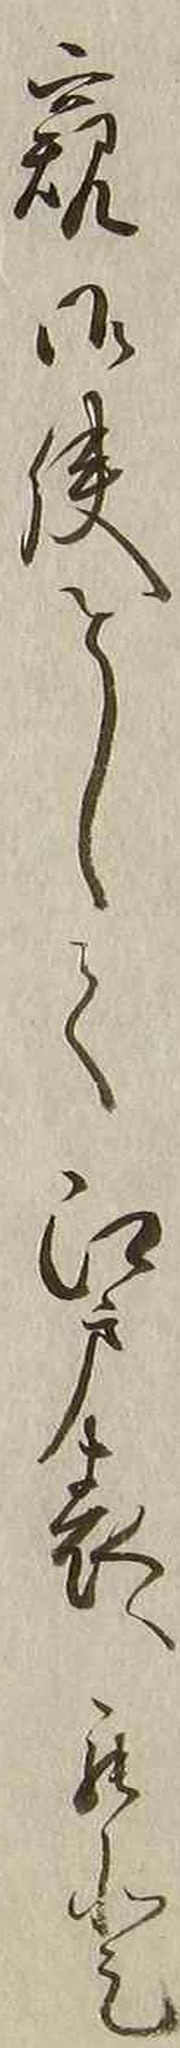窺御使として江戸表へ罷登
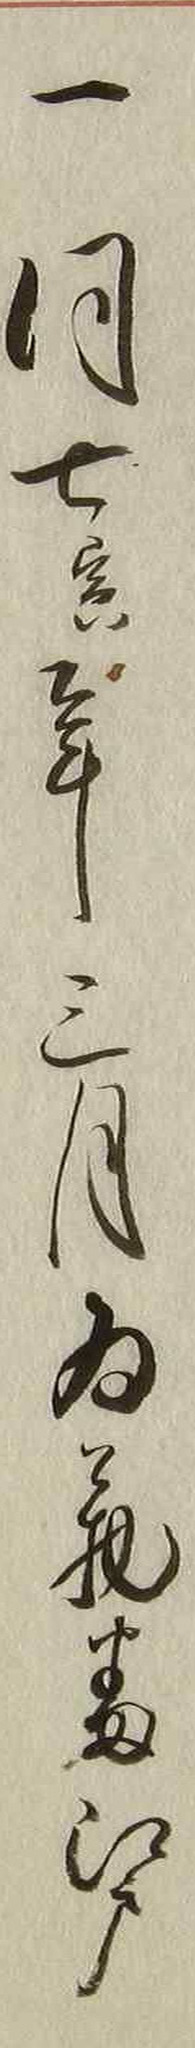一同七寅年三月為勤番江戸
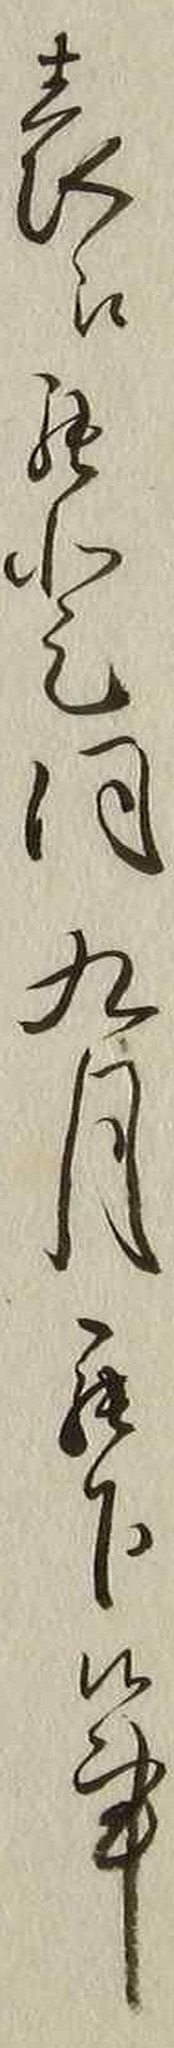表江罷登同九月罷下候事
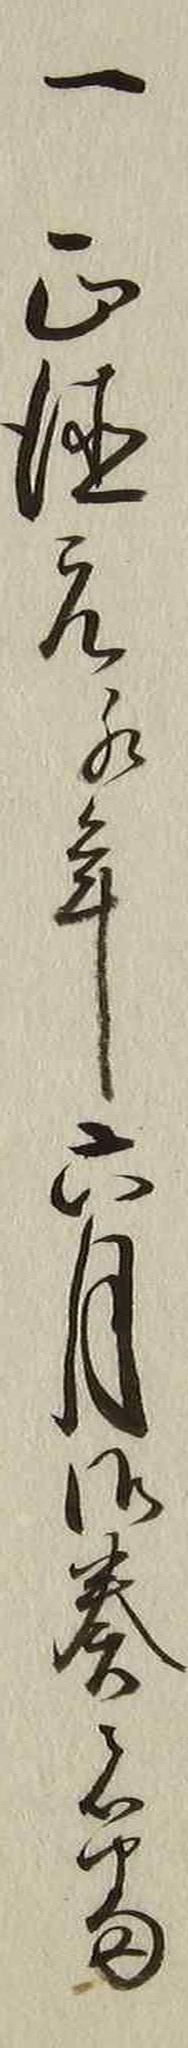一正徳元卯年六月御奏者番
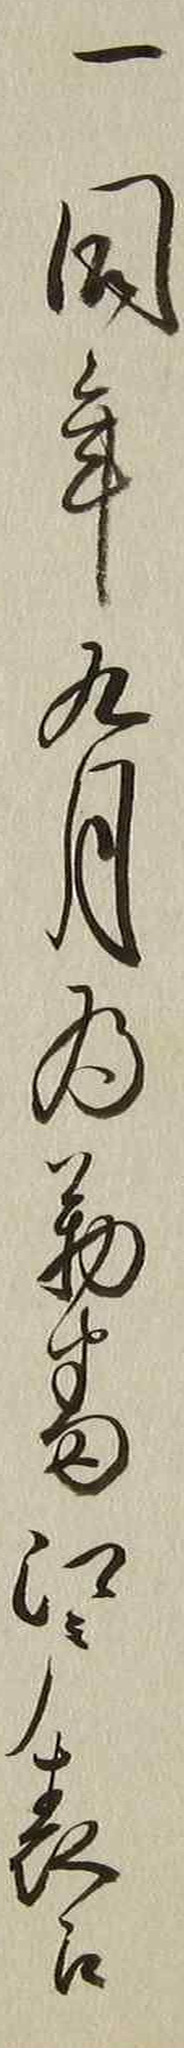一同年九月為勤番江戸表江
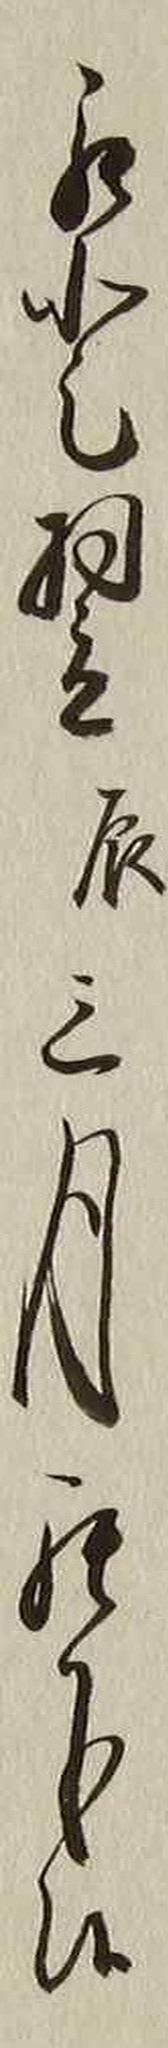罷登翌辰三月罷下候
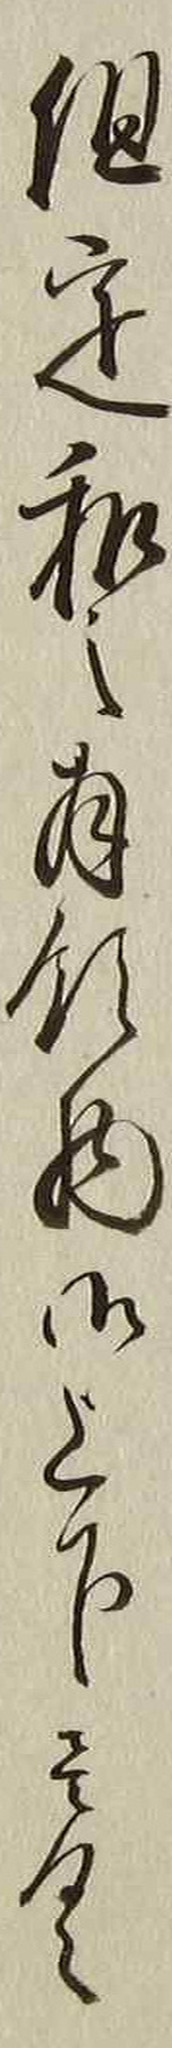但定和之拝領物御上下壱具
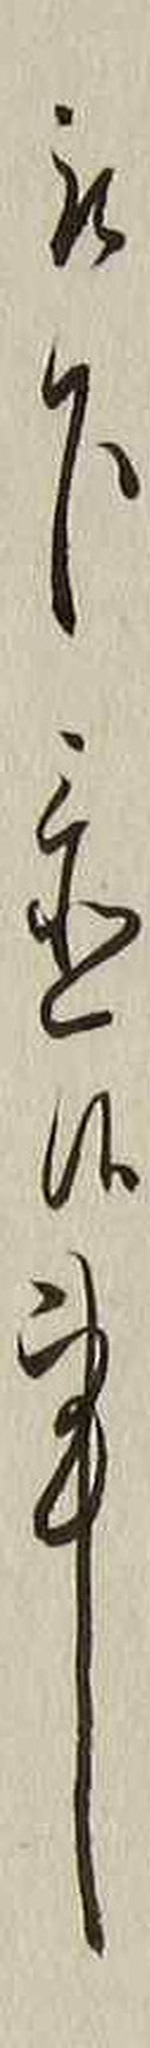被下置候事
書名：諸士系譜　巻之18　い之部18
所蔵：会津若松市立会津図書館
